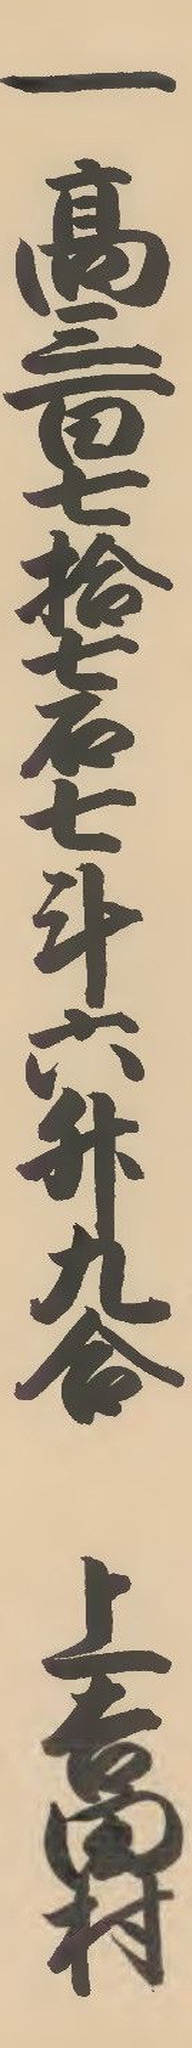一高三百七拾七石七斗六升九合上吉田村
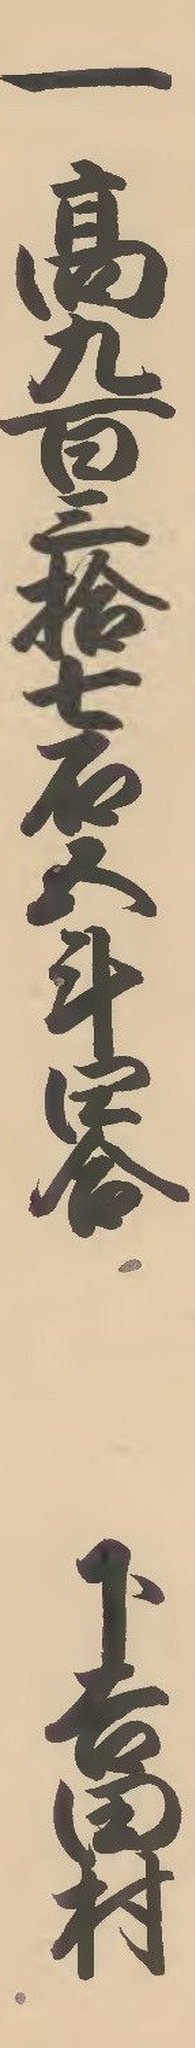一高九百三拾七石五斗四合下吉田村

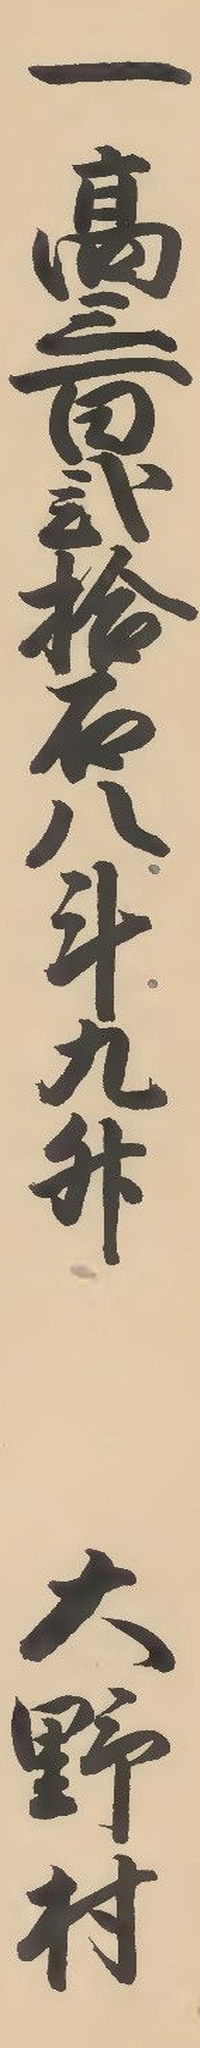一高三百弐拾石八斗九升大野村
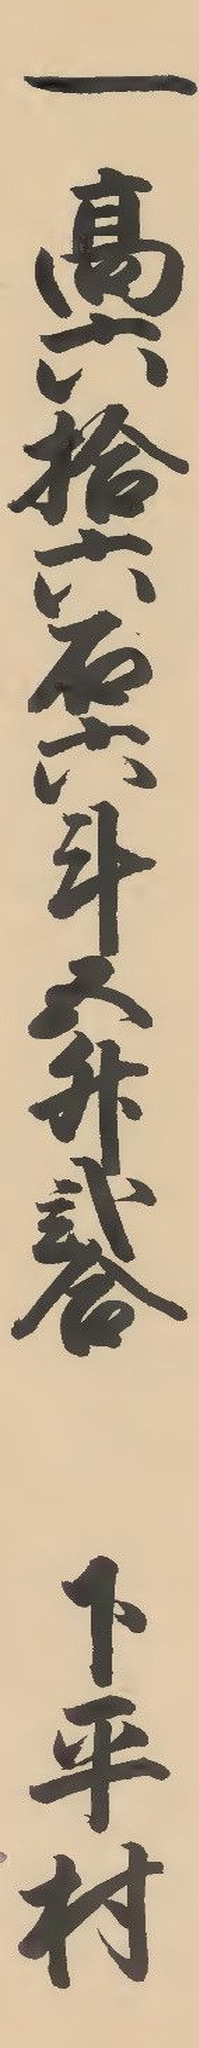一高六拾六石六斗五升弐合下平村
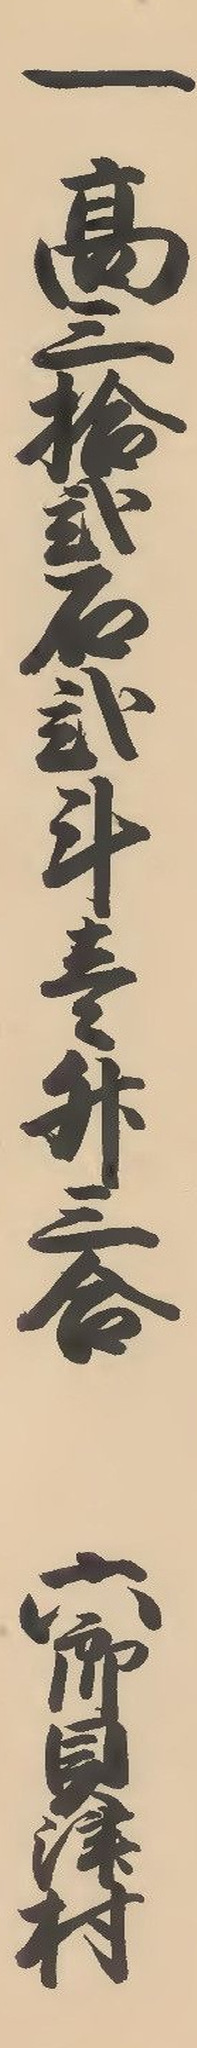一高三拾弐石弐斗壱升三合六郎貝津村
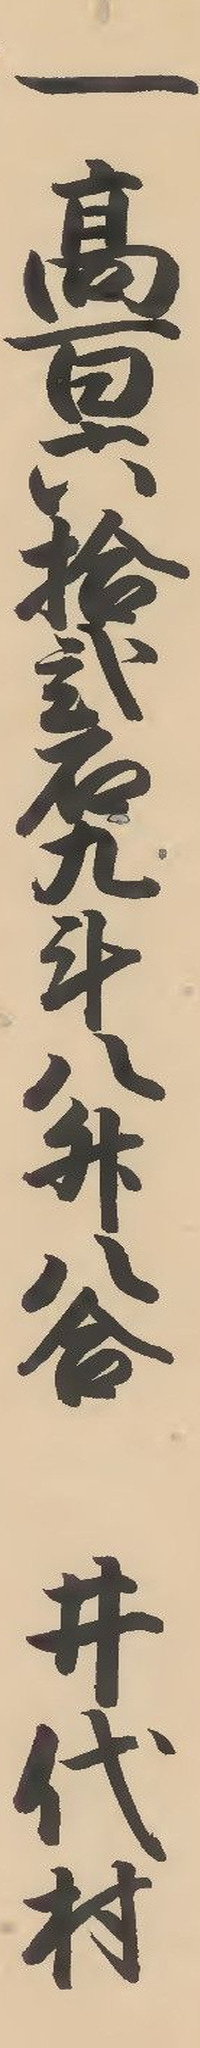一高百六拾弐石九斗八升八合井代村
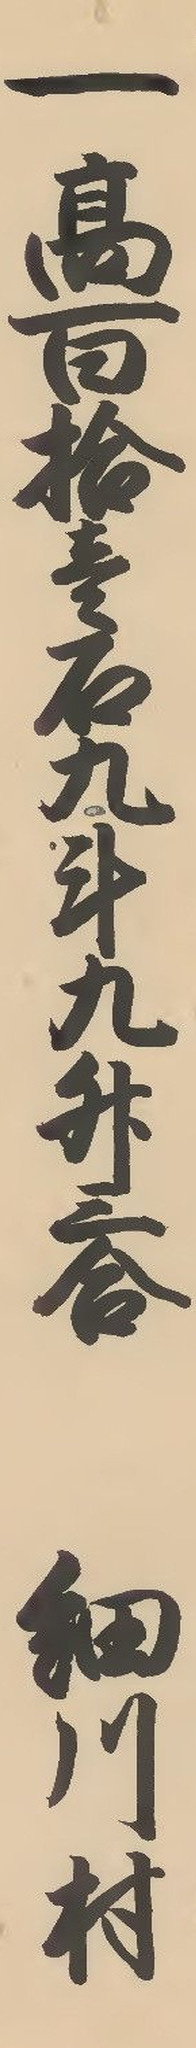一高百拾壱石九斗九升三合細川村
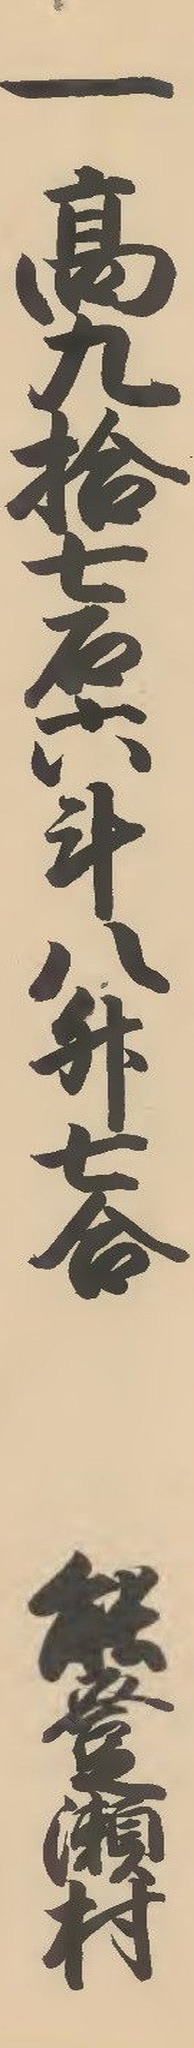一高九拾七石六斗八升七合能登瀬村
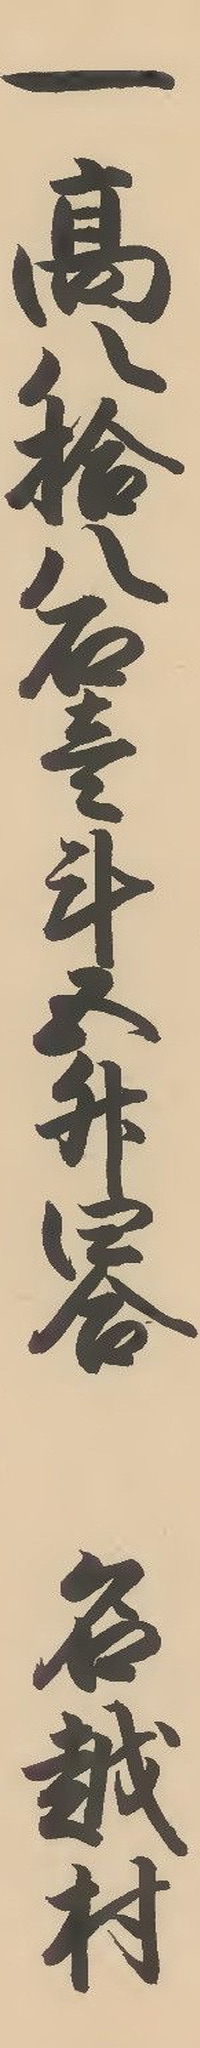一高八拾八石壱斗五升四合名越村
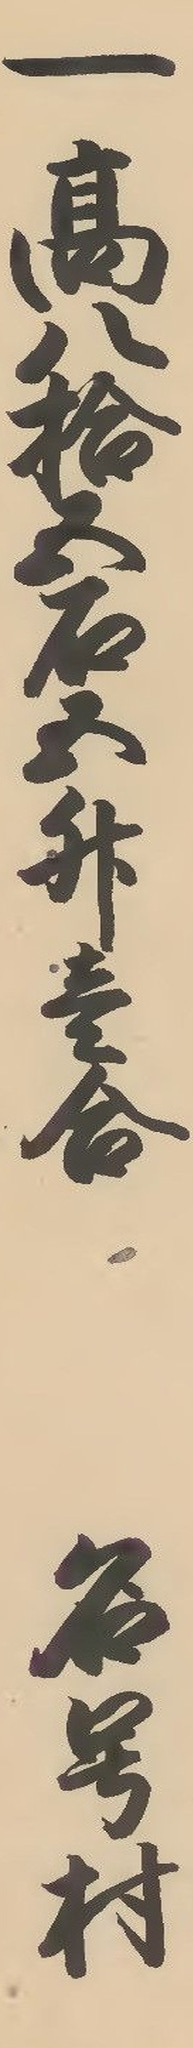一高八拾五石五升壱合名号村

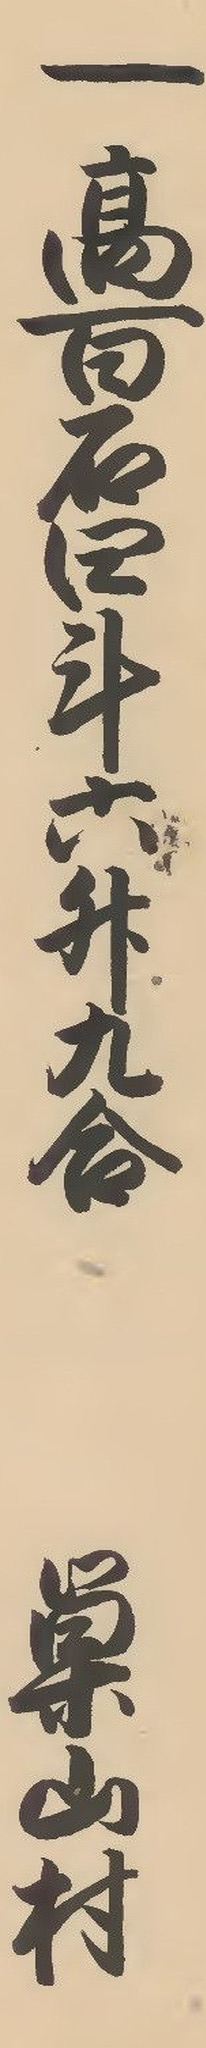一高百石四斗六升九合巣山村
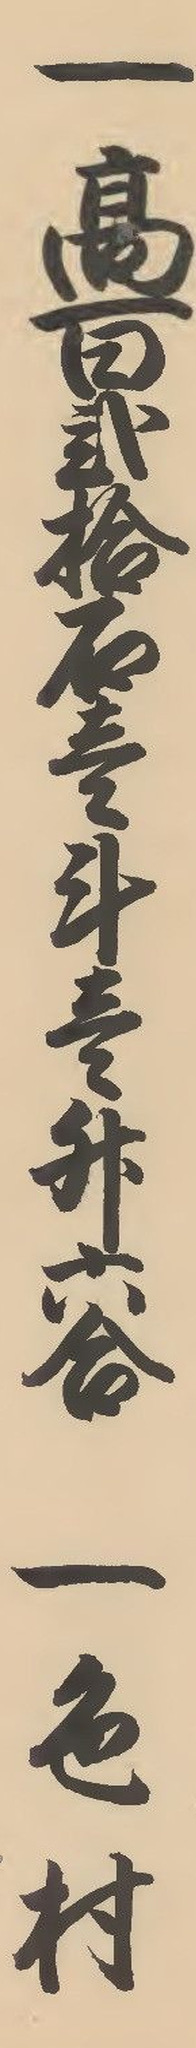一高百弐拾石壱斗壱升六合一色村
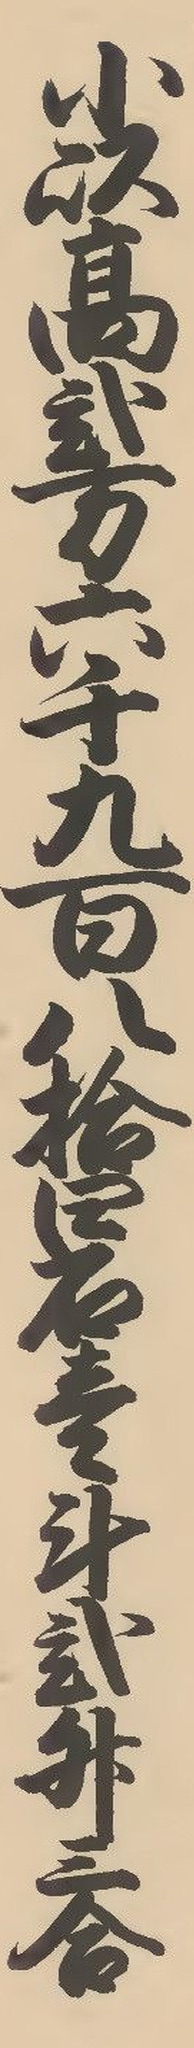小以高弐万六千九百八拾四石壱斗弐升三合
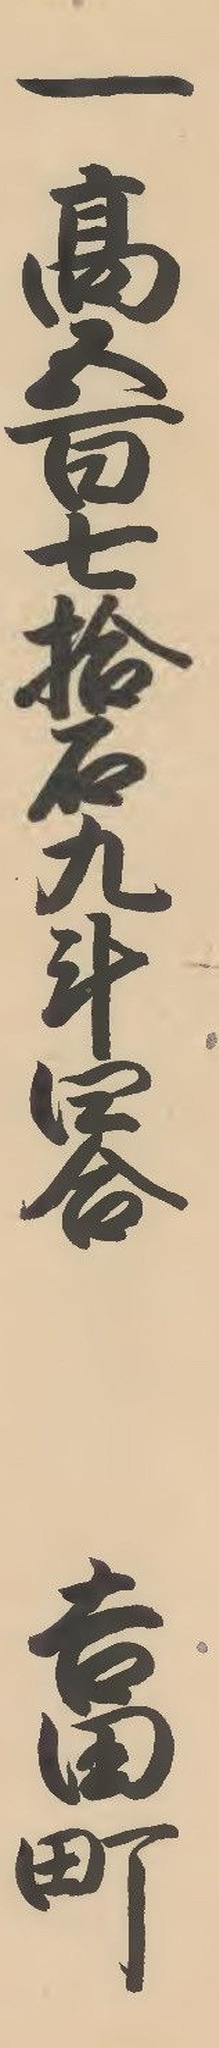一高五百七拾石九斗四合吉田町
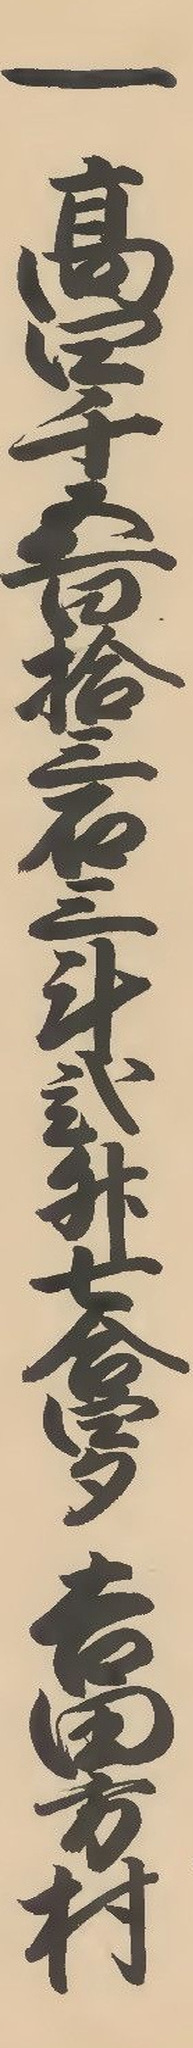一高四千五百拾三石三斗弐升七合四勺吉田方村
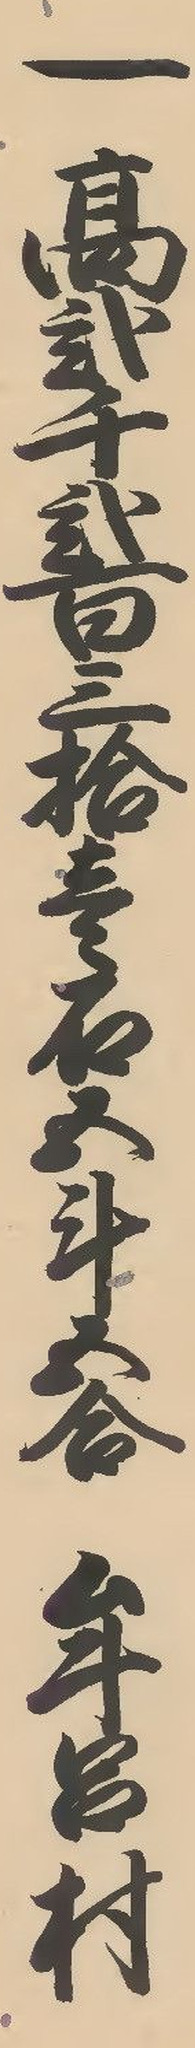一高弐千弐百三拾壱石五斗五合牟呂村
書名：三河国郷帳
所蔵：国立公文書館 National Archives of Japan
